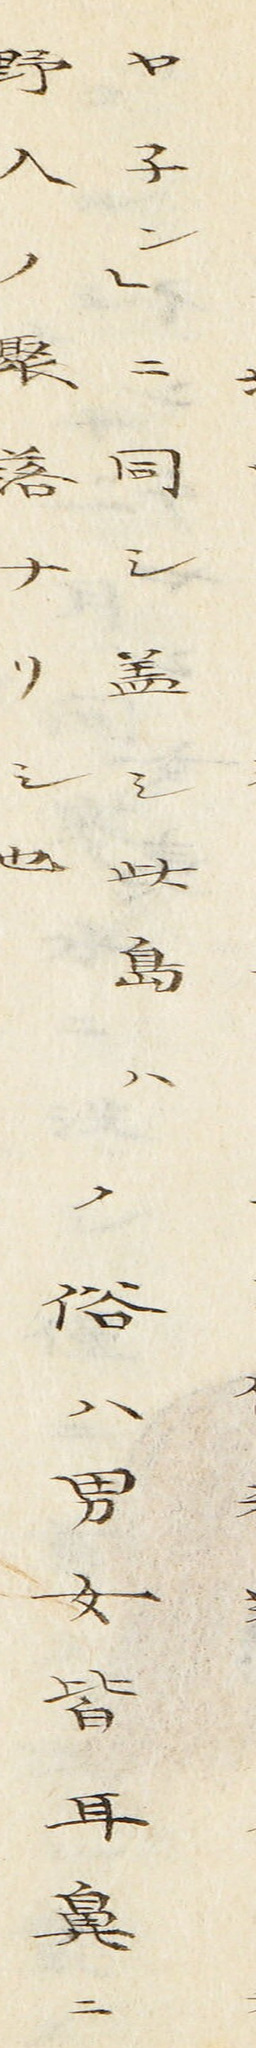ヤネン」ニ同シ蓋シ此島ハ野人ノ聚落ナリシ也ノ俗ハ男女皆耳鼻ニ
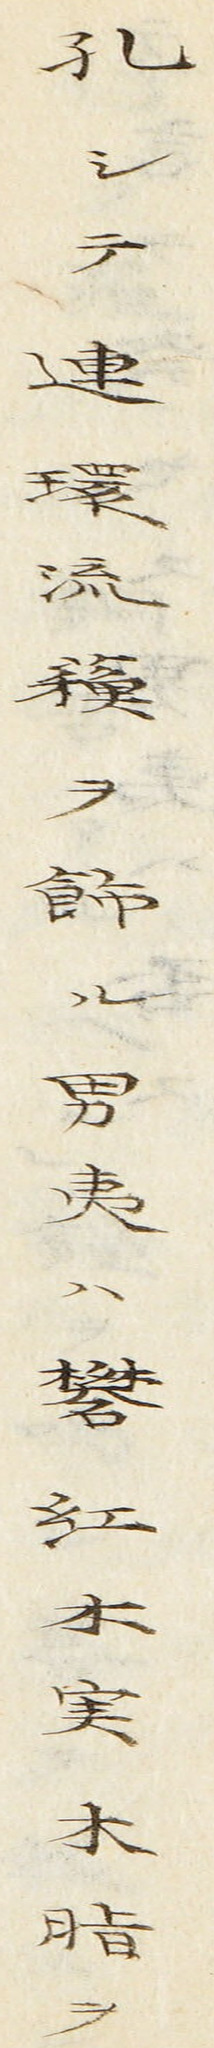孔シテ連環流蘓ヲ飾ル男夷ハ礬紅木実木脂ヲ
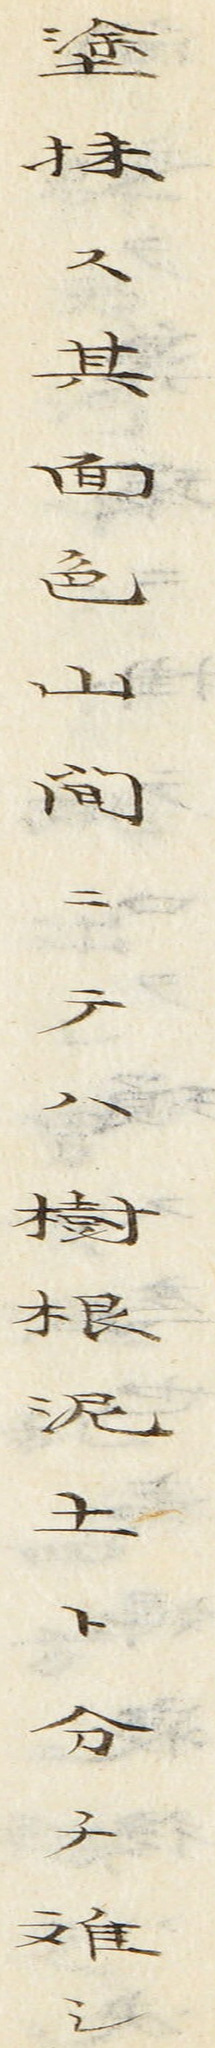塗抹ス其面色山間ニテハ樹根泥土ト分チ難？シ
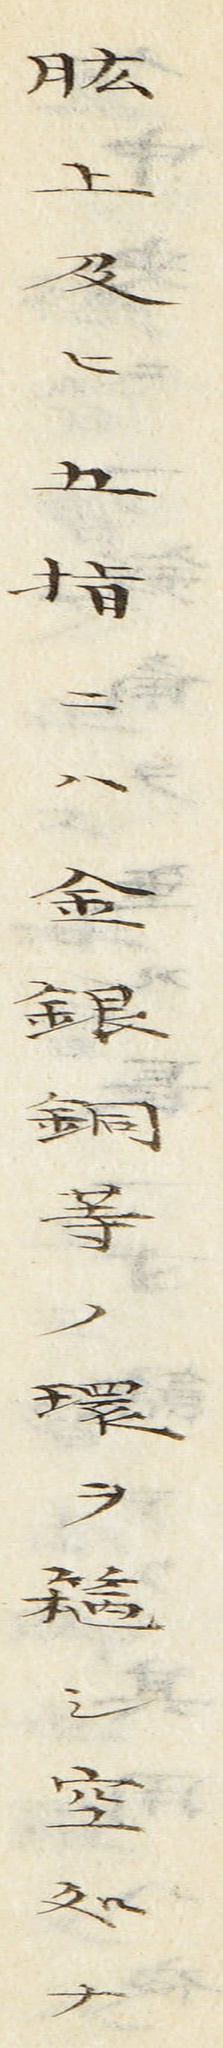肘上及ヒ五指ニハ金銀銅等ノ環ヲシ空処ナ
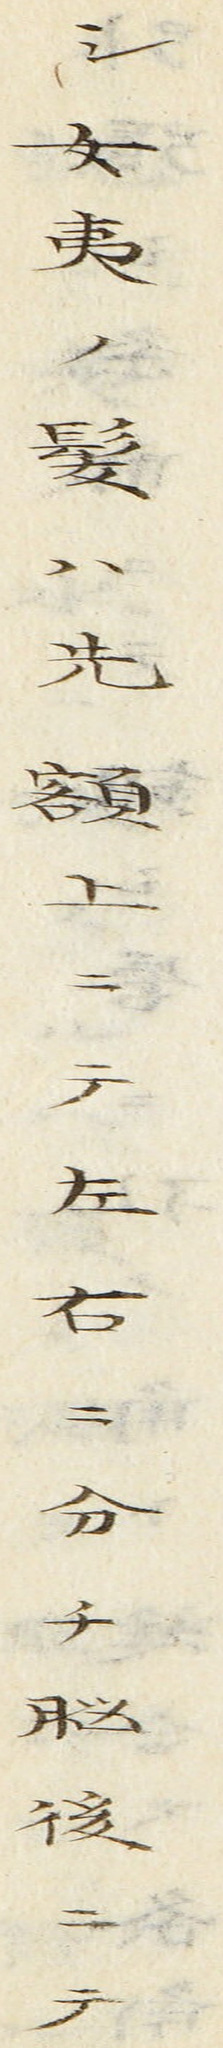シ女夷ノ髪ハ先額上ニテ左右ニ分チ脳後ニテ
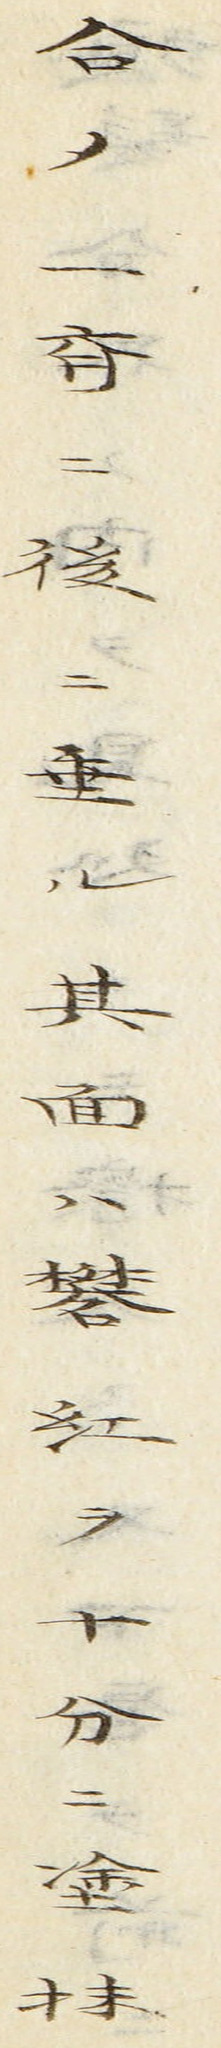合シテ一斉？ニ後ニ垂ル其面ハ礬紅ヲ十分ニ塗抹

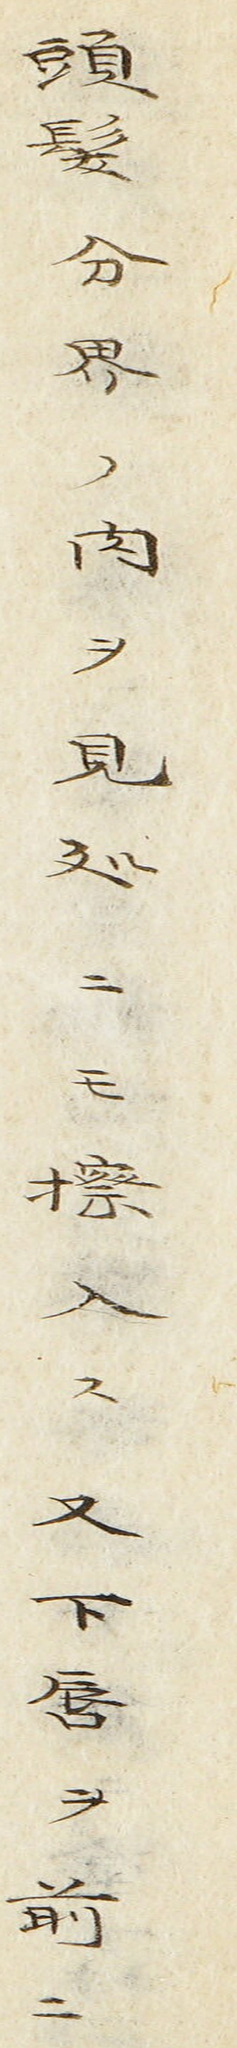頭髪分界ノ内ヲ見処ニモ擦入ス又下唇ヲ前ニ
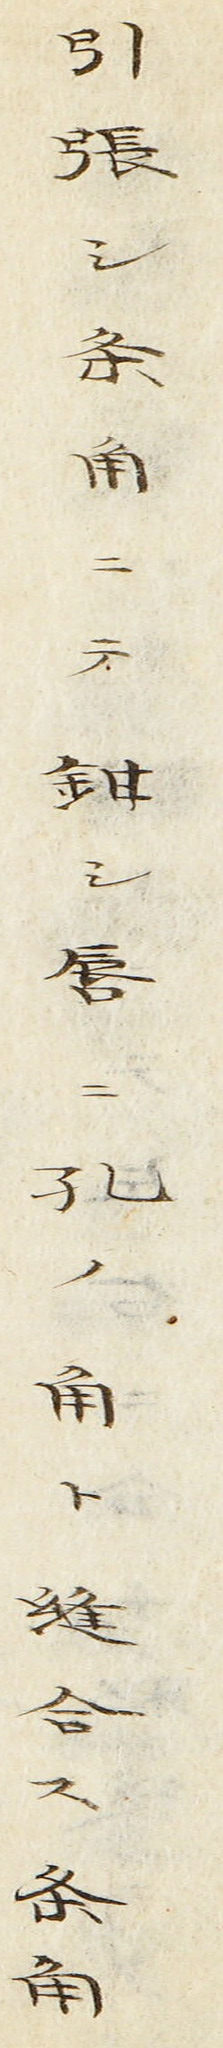引張シ条角ニテ鉗シ唇ニ孔ノ角ト縫合ス条角
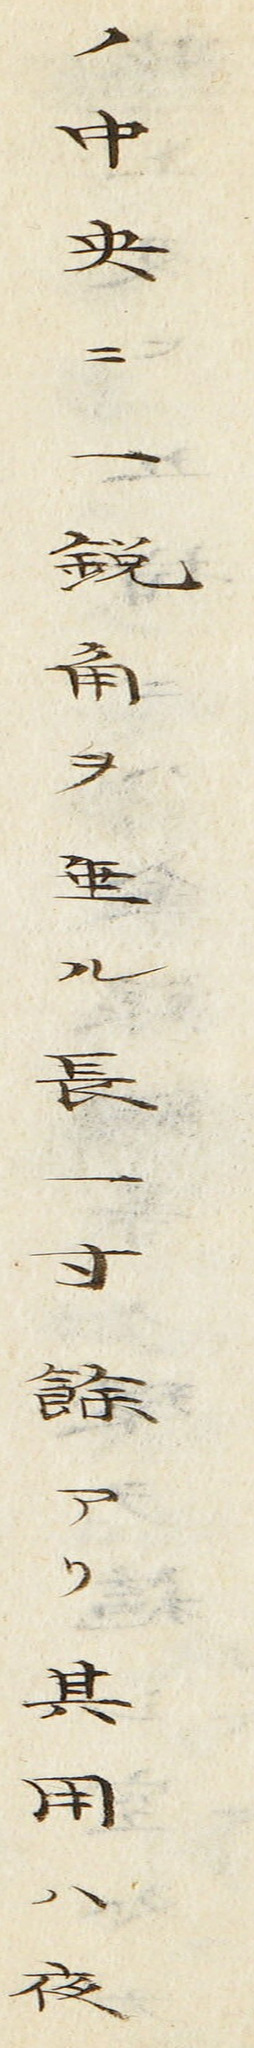ノ中央ニ一鋭角ヲ垂ル長一寸余アリ其用ハ夜
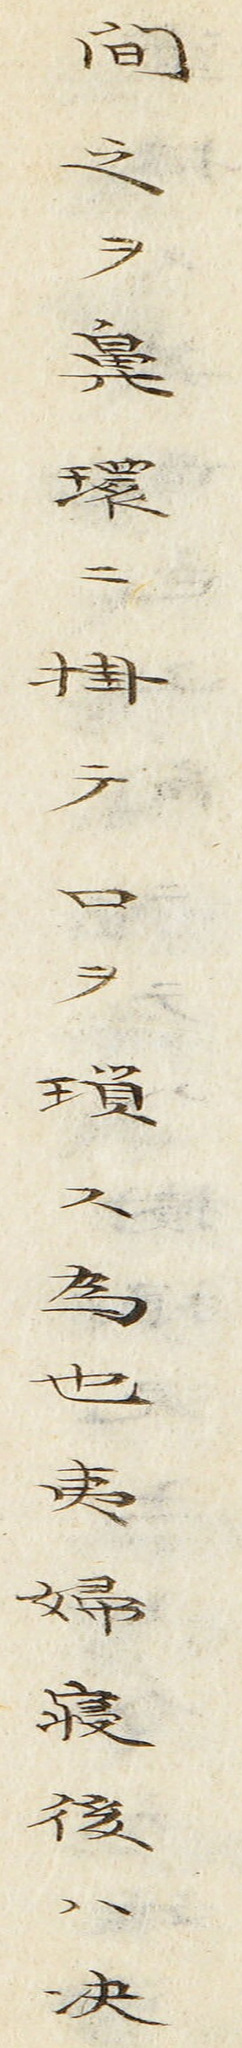間之ヲ鼻環ニ掛テ口ヲ瑣ス為也夷婦寝後ハ決
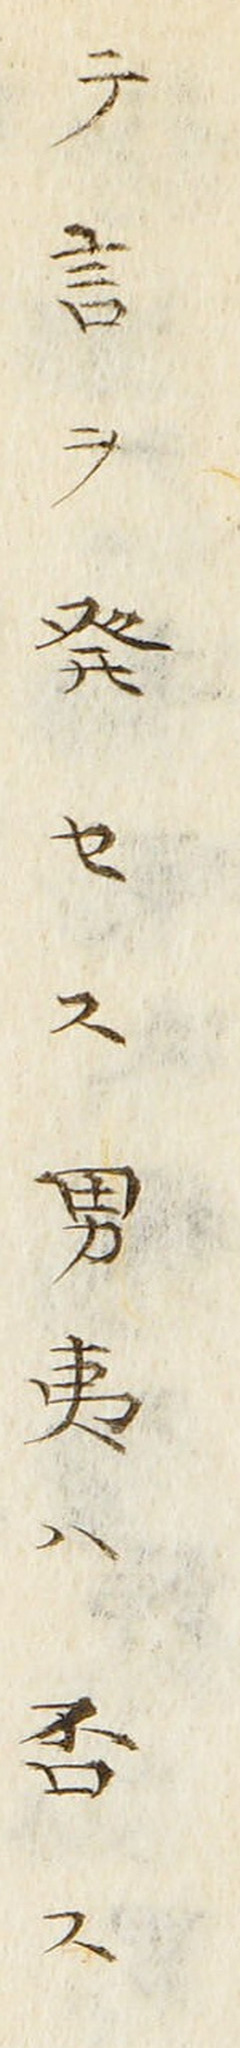テ言ヲ発セス男夷ハ否ス
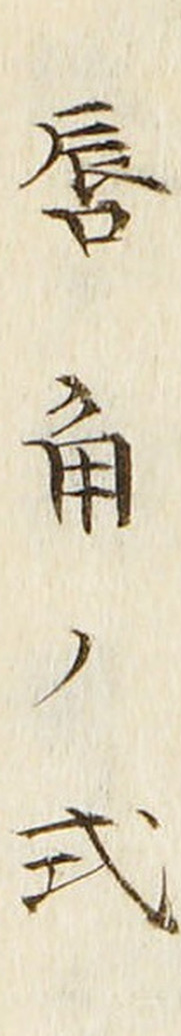唇角ノ式
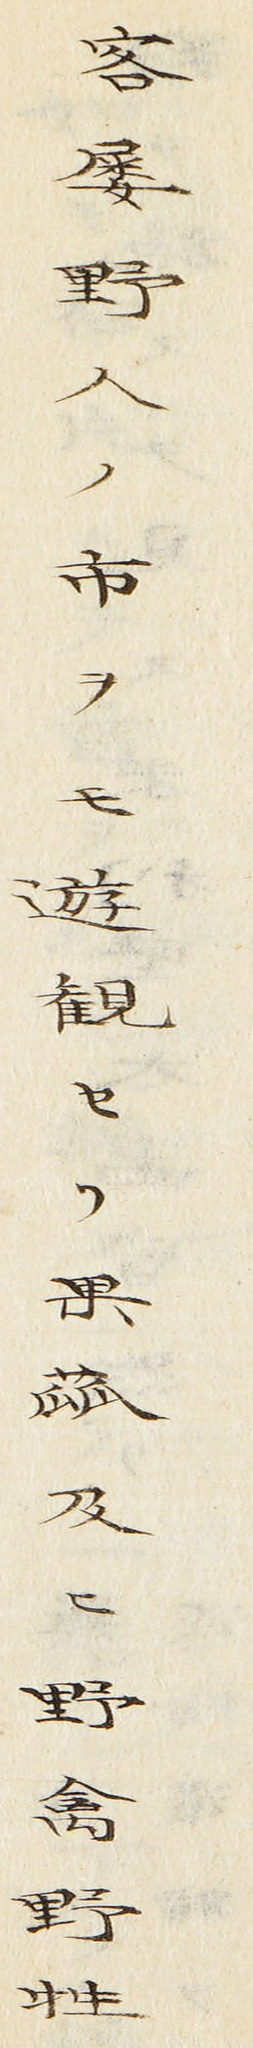客屡野人ノ市ヲモ遊観セリ果蓏及ヒ野禽野牲
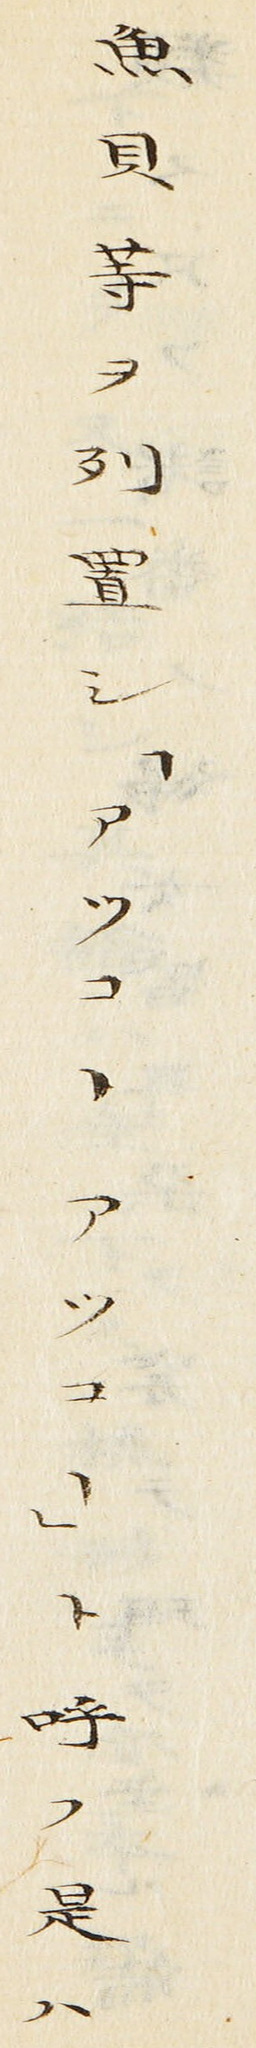魚貝等ヲ列置シ「アツコーアツコー」ト呼フ是ハ
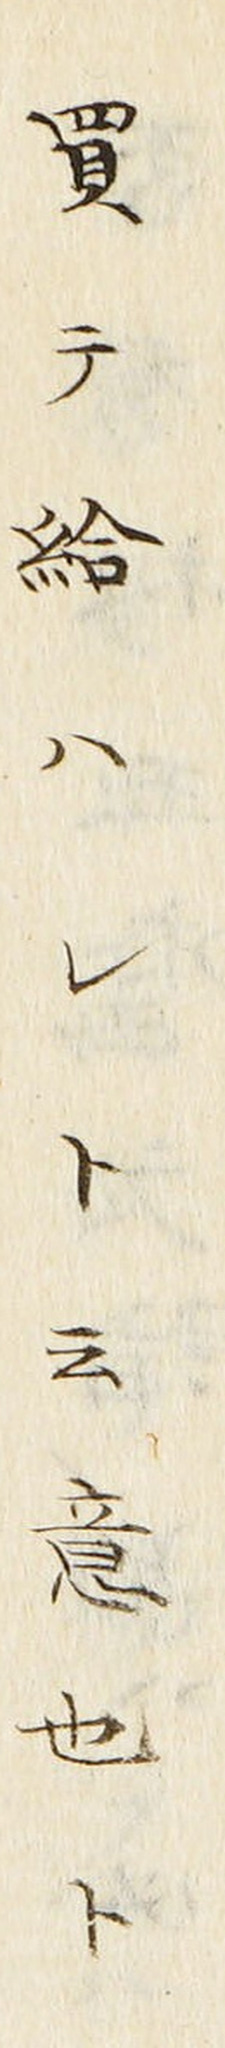買テ給ハント云意也ト
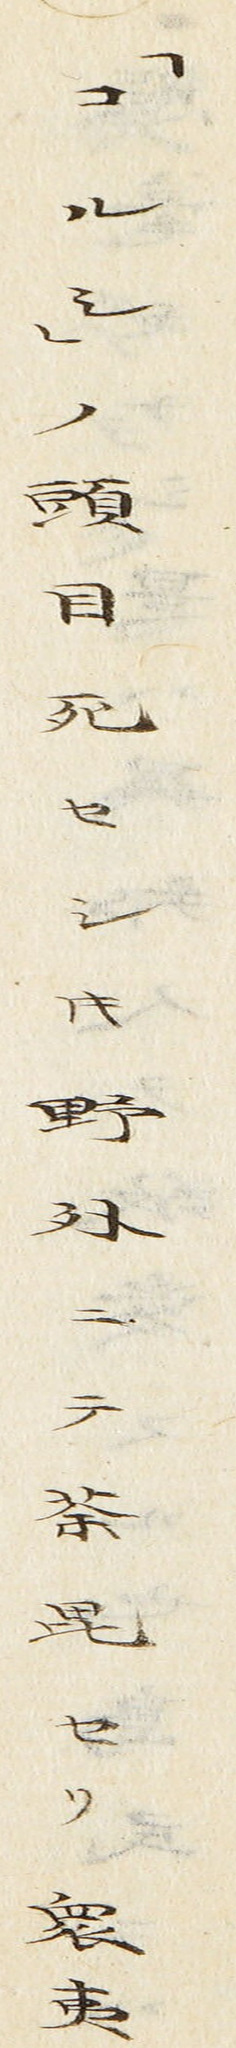〇「コルシ」ノ頭目死セシトキ野外ニテ荼毘セリ衆夷
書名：蕃談
